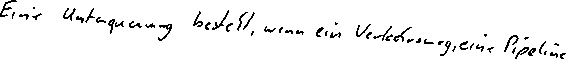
Eine Unterquerung besteht, wenn ein Verkehrsweg, eine Pipeline
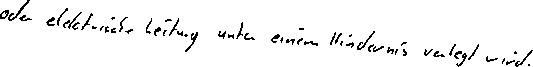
oder eine elektrische Leitung unter einem Hindernis verlegt wird.
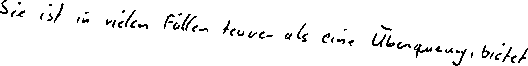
Sie ist in vielen Fällen teurer als eine Überquerung, bietet
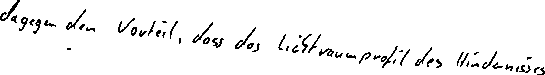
dagegen den Vorteil, dass das Lichtraumprofil des Hindernisses
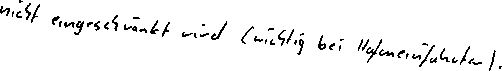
nicht eingeschränkt wird (wichtig bei Hafeneinfahrten).
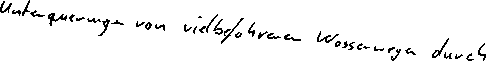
Unterquerungen von vielbefahrenen Wasserwegen durch
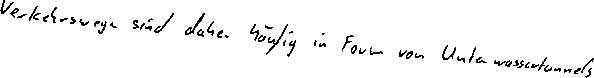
Verkehrswege sind daher häufig in Form von Unterwassertunnels
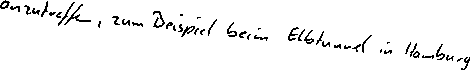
anzutreffen, zum Beispiel beim Elbtunnel in Hamburg
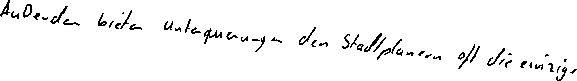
Außerdem bieten Unterquerungen den Stadtplanern oft die einzige
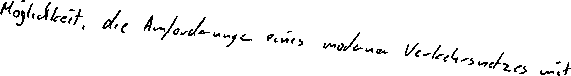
Möglichkeit, die Anforderungen eines modernen Verkehrsnetzes mit
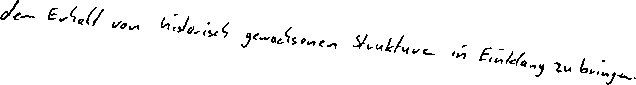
dem Erhalt von historisch gewachsenen Strukturen in Einklang zu bringen.
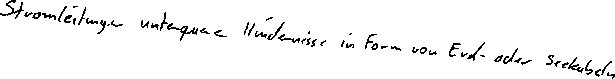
Stromleitungen unterqueren Hindernisse in Form von Erd- oder Seekabeln
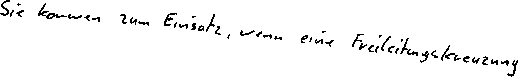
Sie kommen zum Einsatz, wenn eine Freileitungskreuzung
